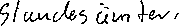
Standesämter.
